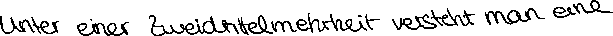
Unter einer Zweidrittelmehrheit versteht man eine
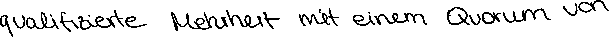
qualifizierte Mehrheit mit einem Quorum von
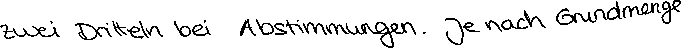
zwei Dritteln bei Abstimmungen. Je nach Grundmenge
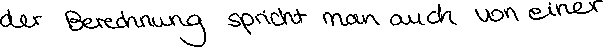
der Berechnung spricht man auch von einer
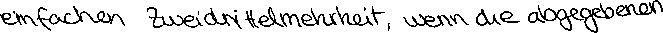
einfachen Zweidrittelmehrheit, wenn die abgegebenen
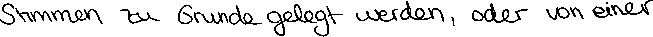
Stimmen zu Grunde gelegt werden, oder von einer
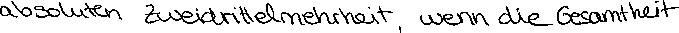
absoluten Zweidrittelmehrheit, wenn die Gesamtheit
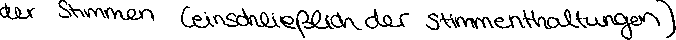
der Stimmen (einschließlich der Stimmenthaltungen)
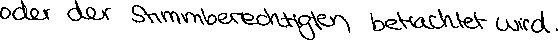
oder der Stimmberechtigten betrachtet wird.
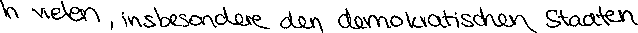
In vielen, insbesondere den demokratischen Staaten
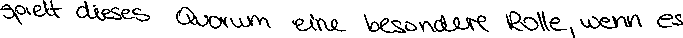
spielt dieses Quorum eine besondere Rolle, wenn es
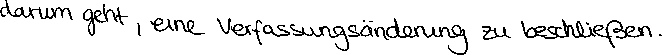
darum geht, eine Verfassungsänderung zu beschließen.
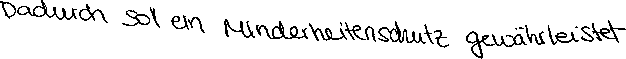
Dadurch soll ein Minderheitenschutz gewährleistet
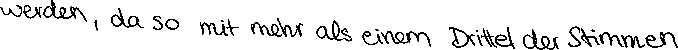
werden, da so mit mehr als einem Drittel der Stimmen
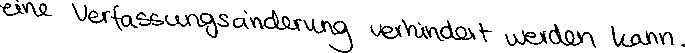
eine Verfassungsänderung verhindert werden kann.
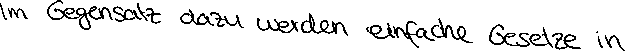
Im Gegensatz dazu werden einfache Gesetze in
